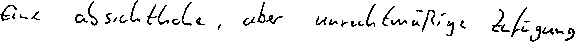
Eine absichtliche, aber unrechtmäßige Zufügung
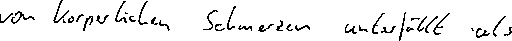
von körperlichen Schmerzen unterfällt als
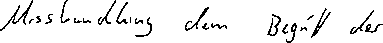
Misshandlung dem Begriff der
